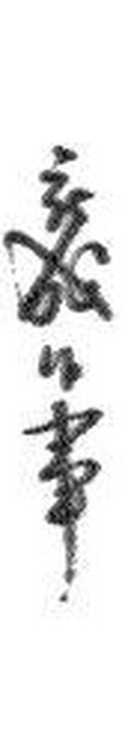被成候事
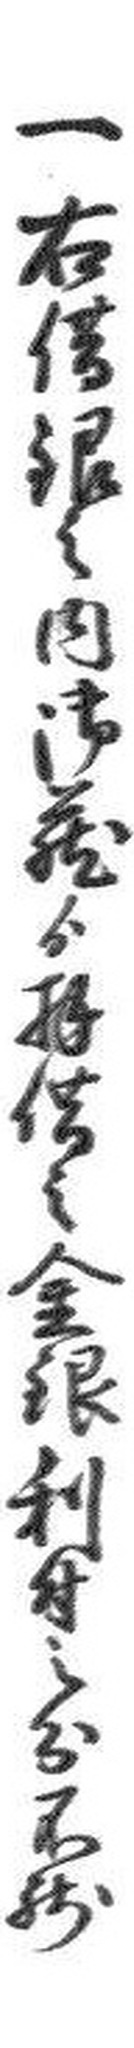一右借銀之内御蔵ゟ拝借之金銀利付之分不残
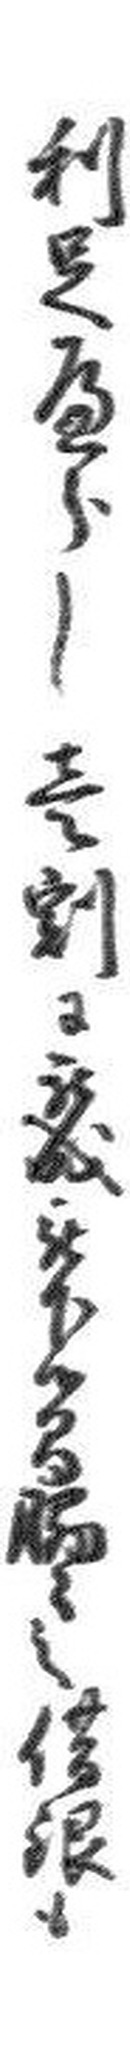利足へらし壱割に被成被下候間脇々之借銀も
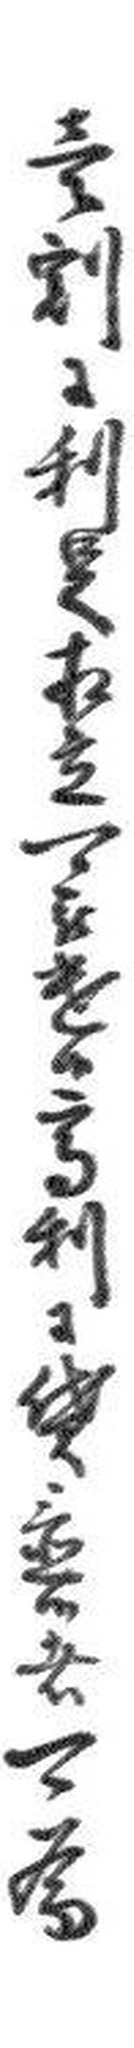壱割に利足相立可被遣候高利に貸置候者可為
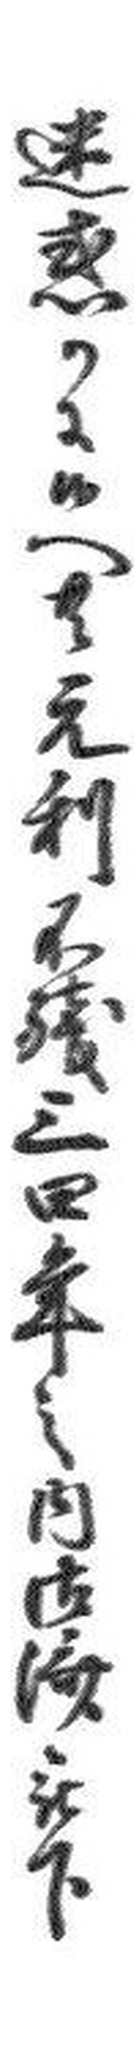迷惑かに候へ共元利不残三四年之内御済被下
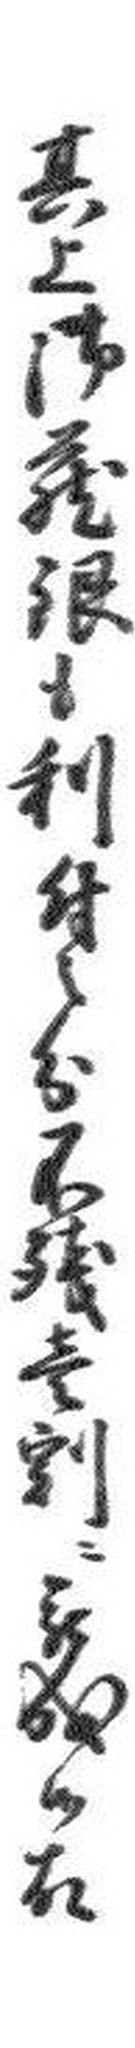其上御蔵銀も利付之分不残壱割ニ被成候故
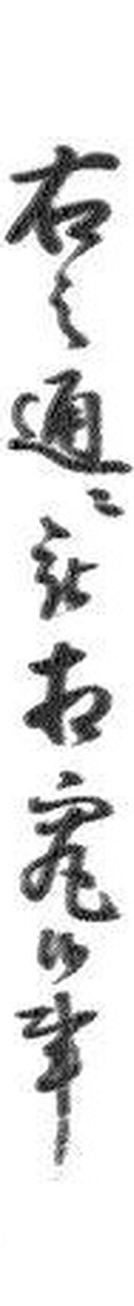右之通ニ被相究候事

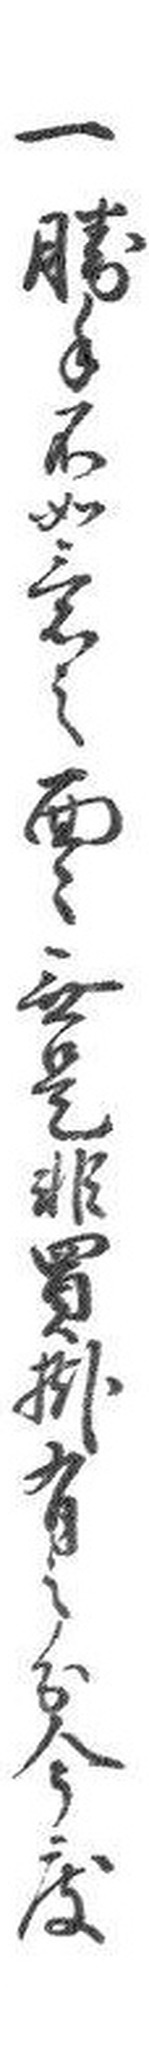一勝手不如意之面々無是非買掛有之分今度
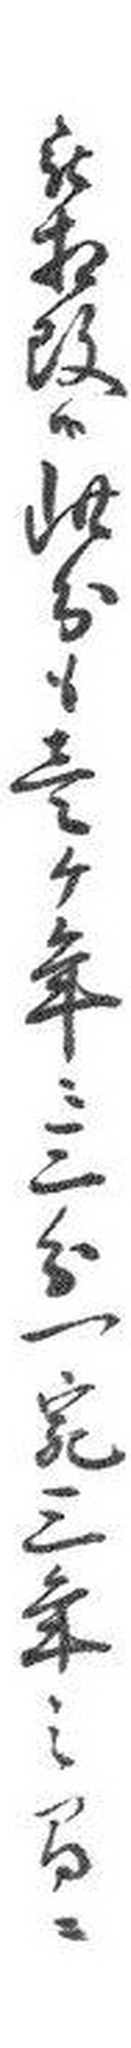被相改候此分も壱ケ年ニ三分一宛三年之間ニ
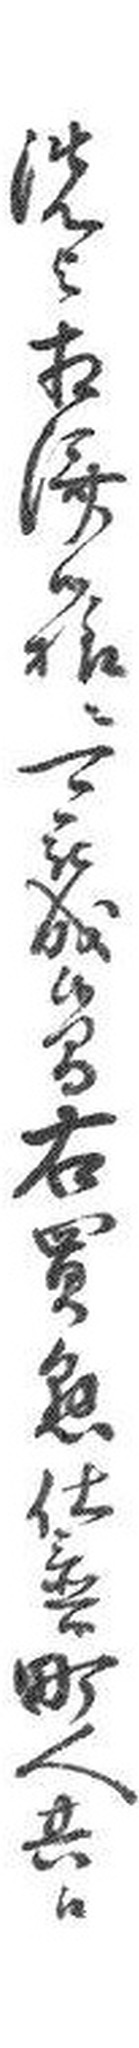洗と相済候様ニ可被成候間右買懸仕置候町人共江
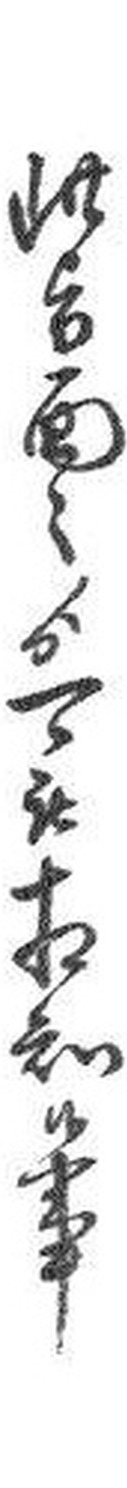此旨面々ゟ可被相知候事
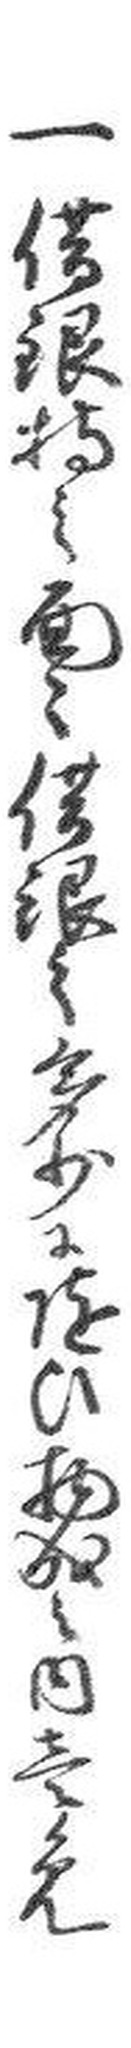一借銀持之面々借銀之多少に随ひ物成之内壱免
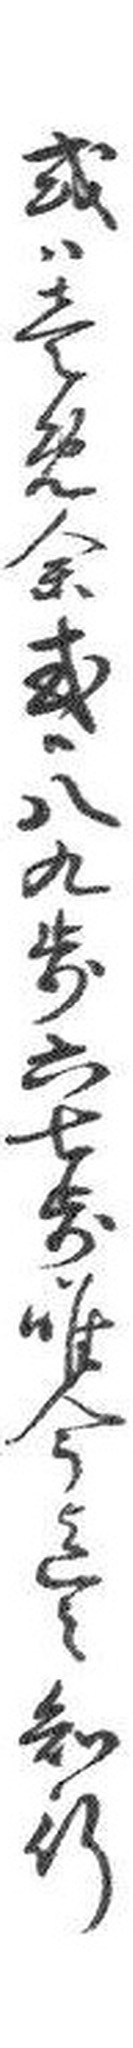或は壱免余或は八九歩六七歩唯今迄之知行
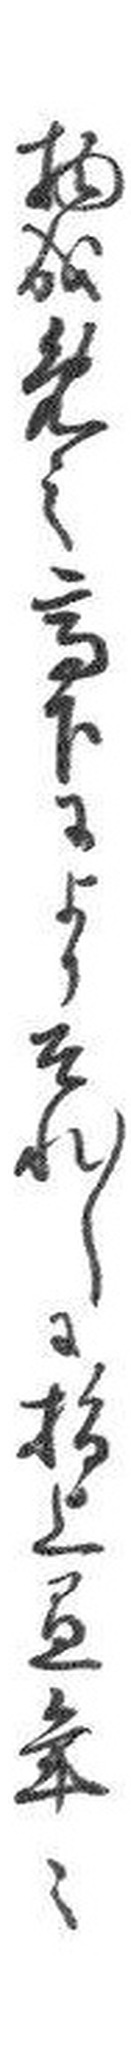物成免之高下によりそれ〳〵に指上置年々
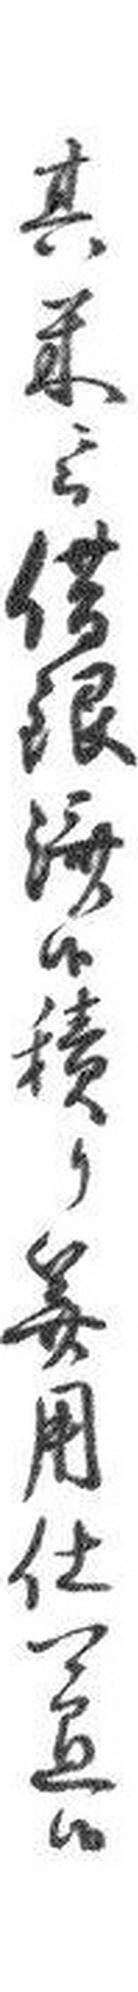其米ニ而借銀済候積り算用仕可置候
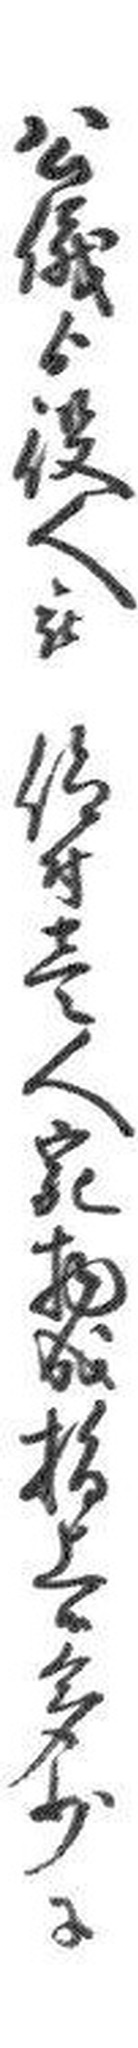公儀ゟ役人被仰付壱人宛物成指上候多少に
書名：家譜 八 光通公 従寛文十年到同十二年
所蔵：福井県文書館 Fukui Prefectural Archives
